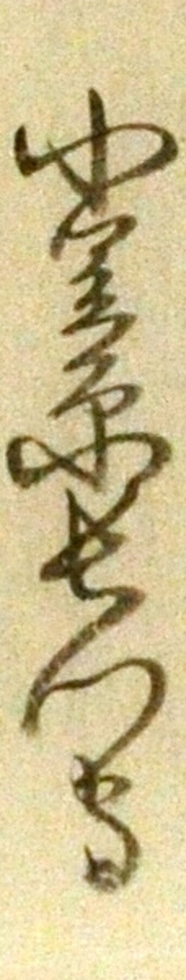小笠原長門守
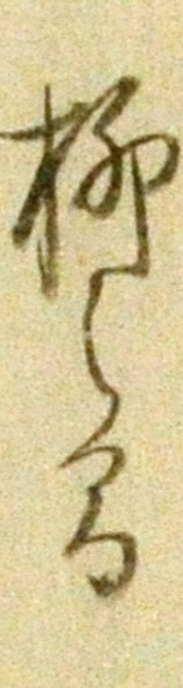柳之間
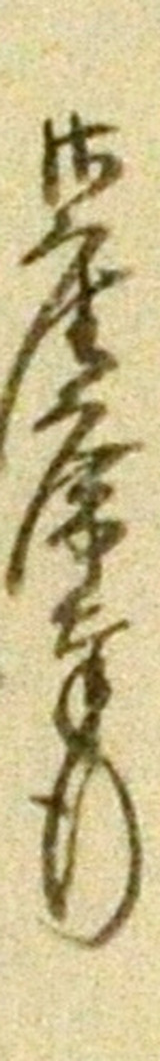御座席奉行

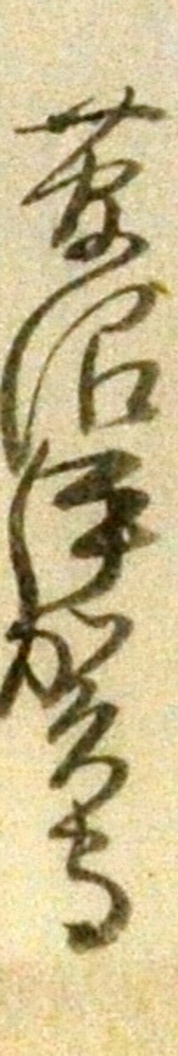菅沼伊賀守
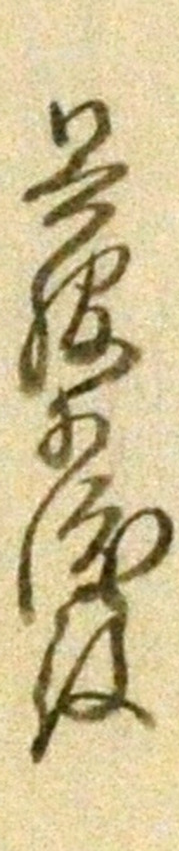呉服相渡役
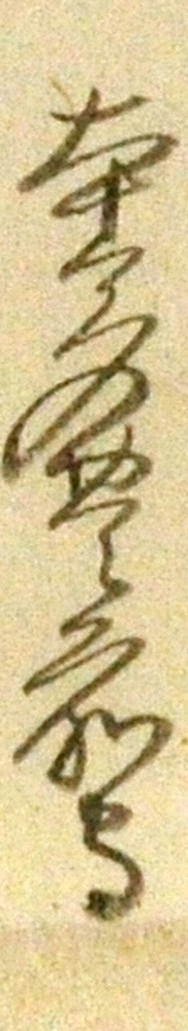本多豊前守
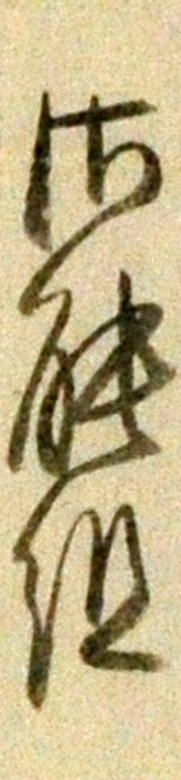御能組
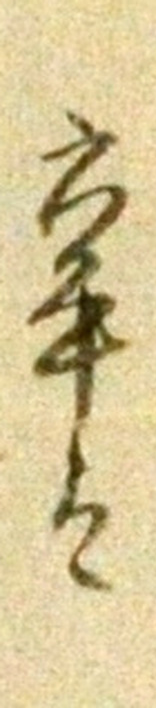六平太
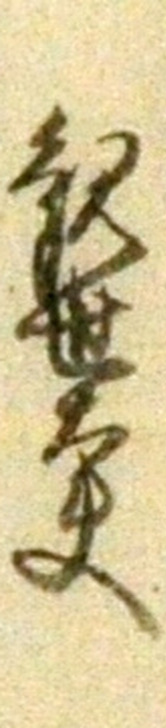観世大夫

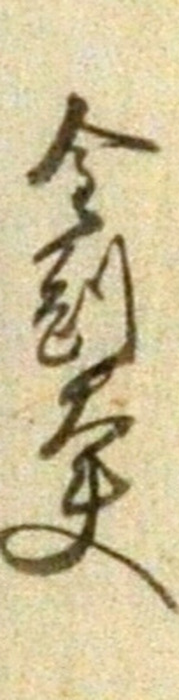金剛大夫
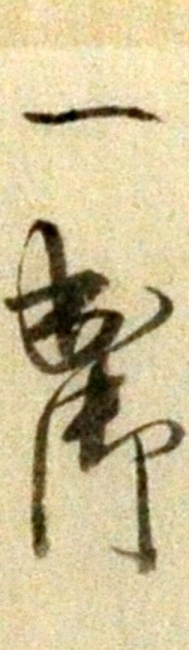一入御
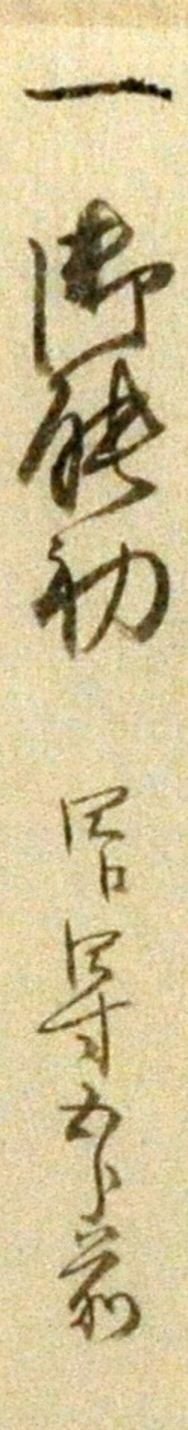一御能初四え四寸五分前
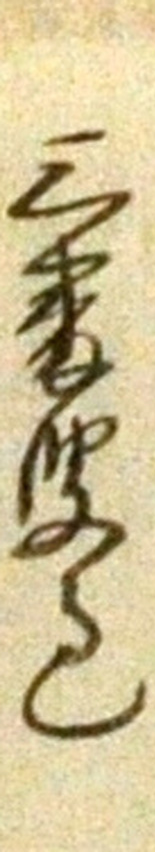三番叟過
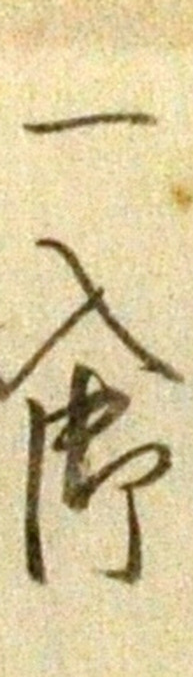一入御
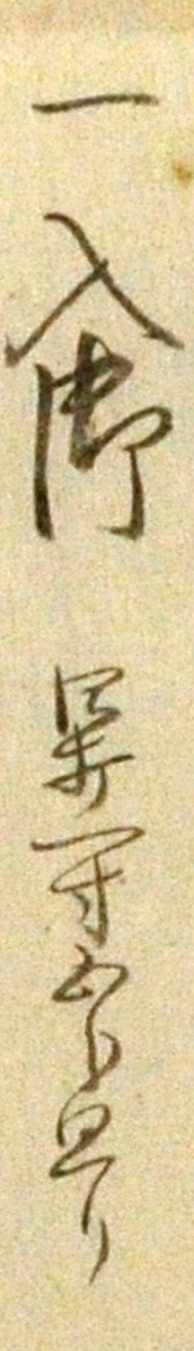一入御四打一寸五分廻り
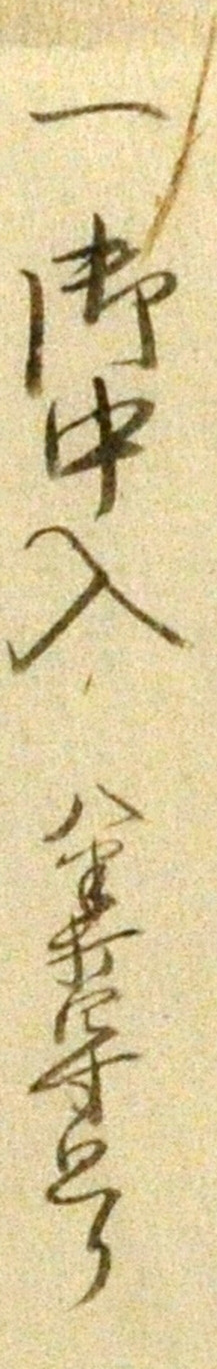一御中入八半打四寸廻り
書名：御馳走御能ノ節ノ留外
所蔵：伊那市立高遠町図書館・合同会社AMANE
